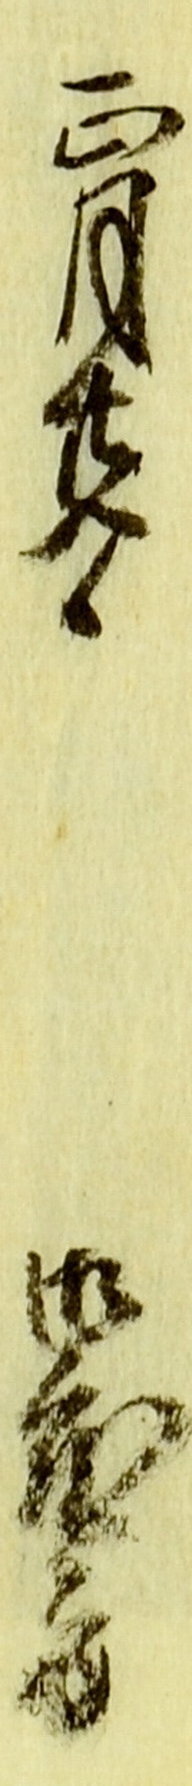正月廿八日御蔵方
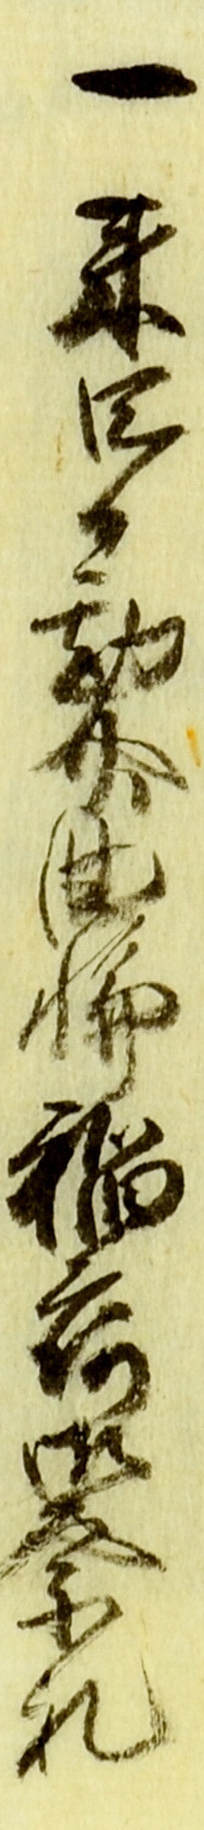一来四日勘介曲輪稲荷御祭礼
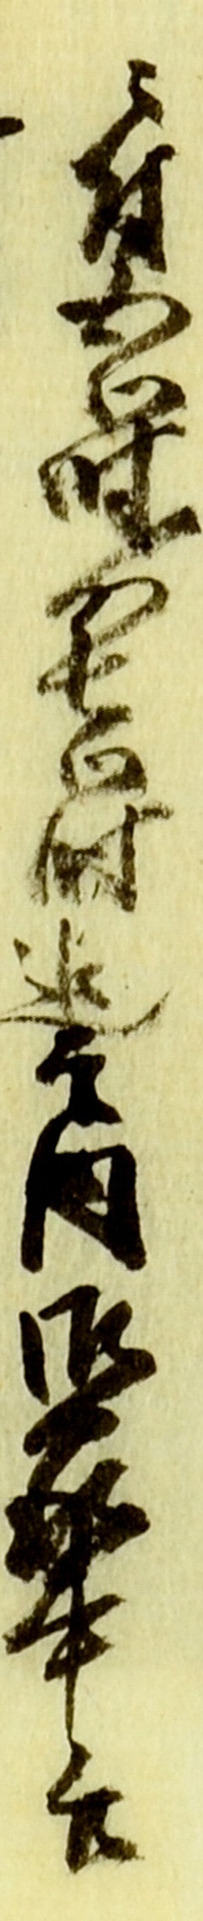ニ付五ツ時ゟ七ツ時迄之内御家中共
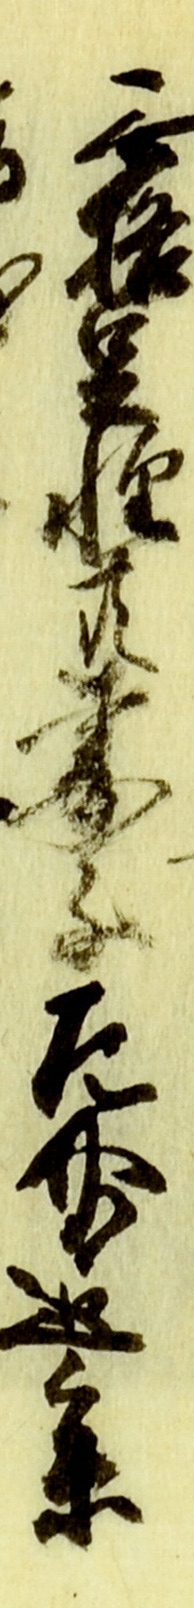無格足軽共妻子厄介迄参
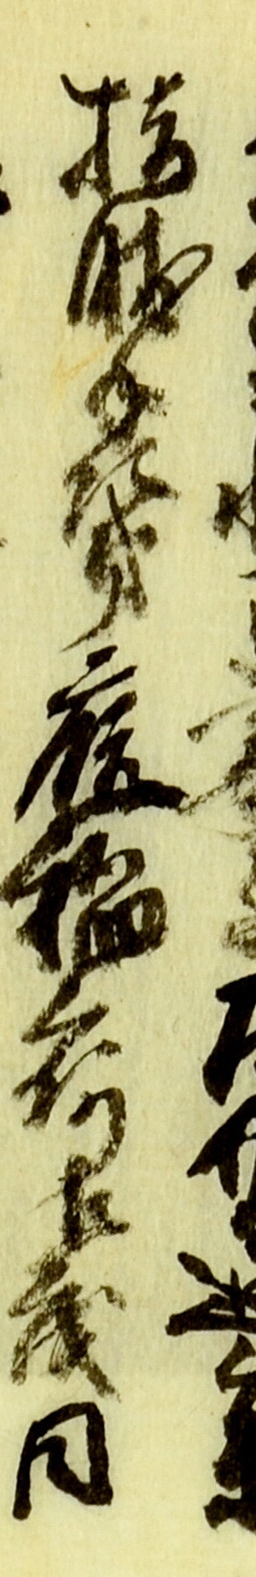詣勝手次第厩稲荷江茂同
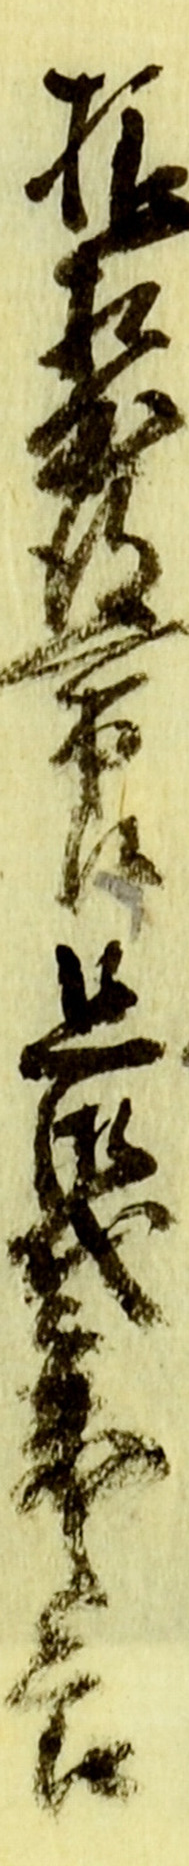様相出役可申候且御代被参候節
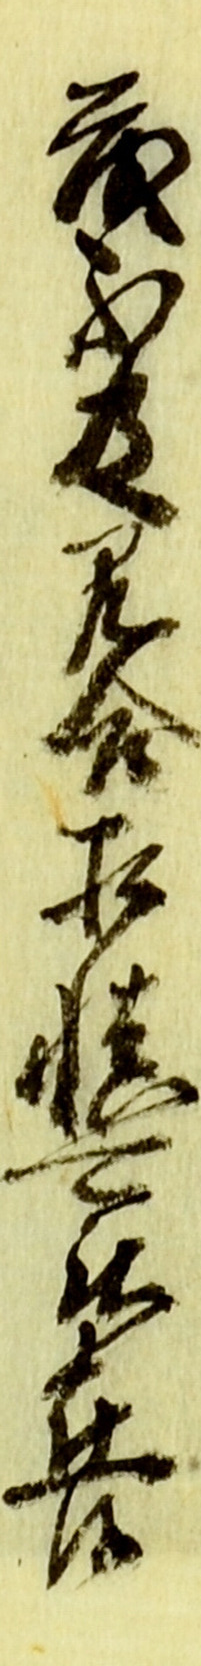茂不及見合相慎可罷在候
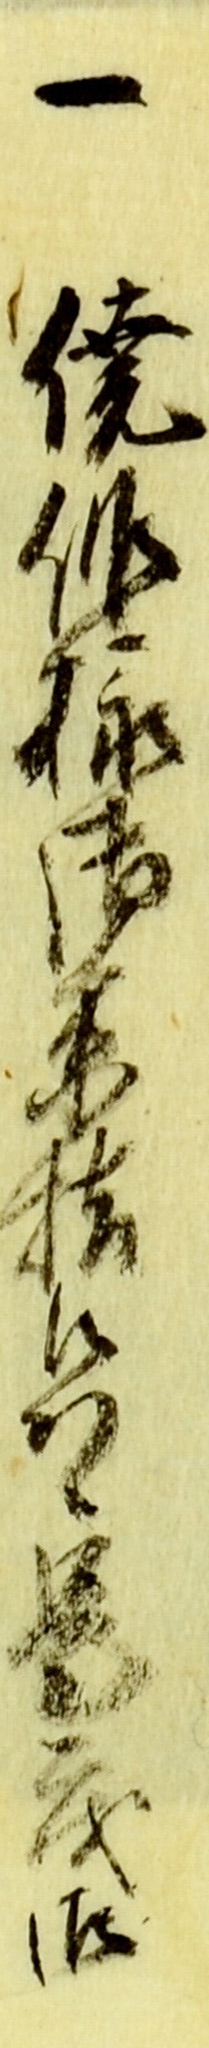一僥作様御参詣候ハゝ是茂御
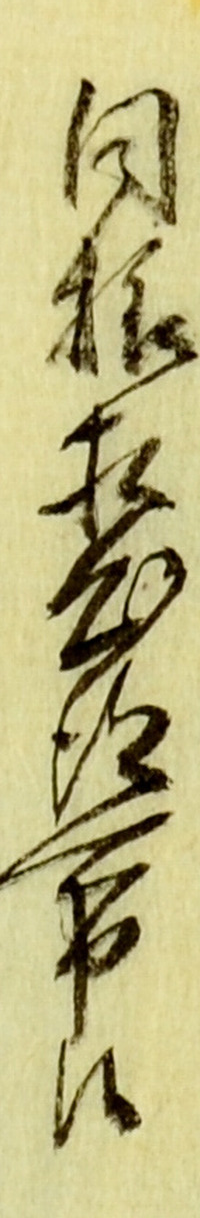同様相心得可申候

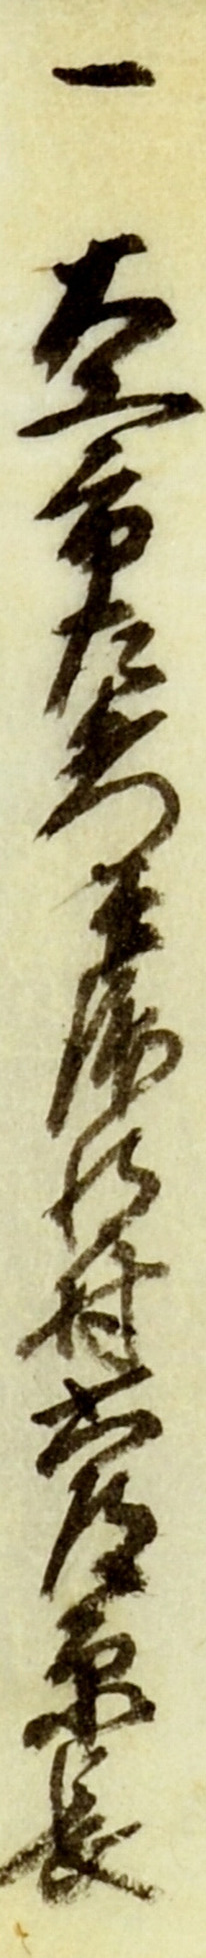一大工市左衛門幷鉾持村六道原長
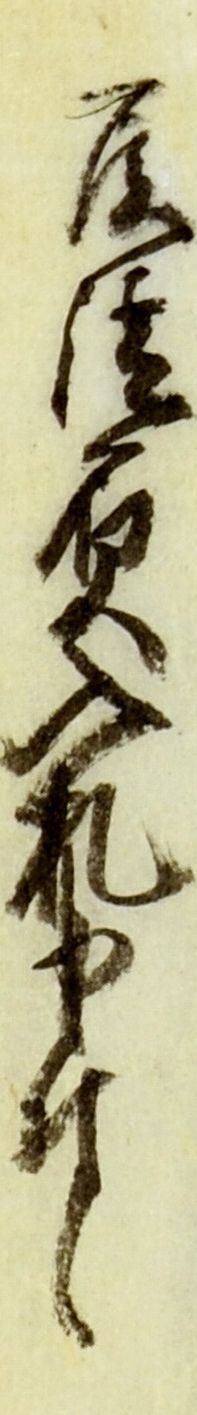蔵請負入札申付候
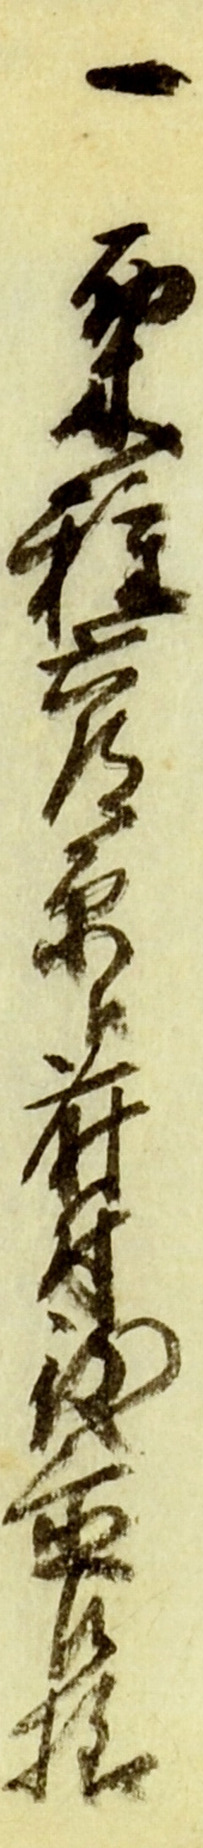一栗種六道原江蒔付致置候様
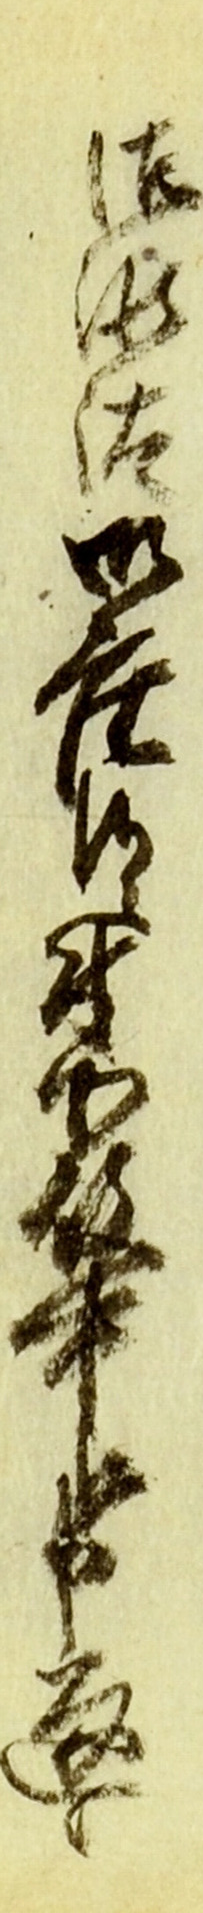御沙汰御座候ニ付下役中江申通
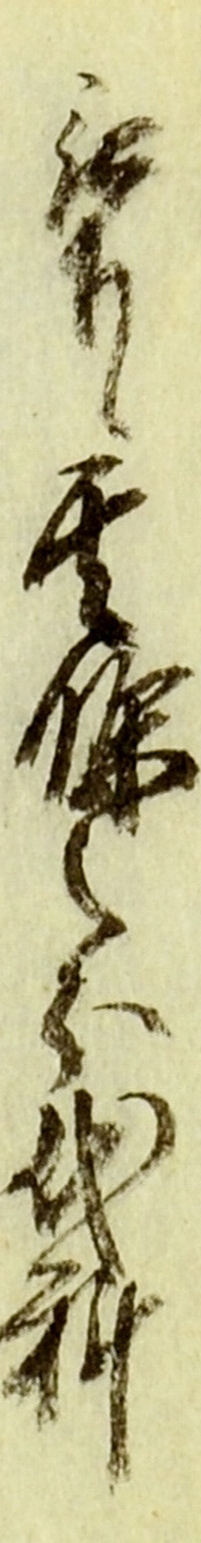被下候其余之分代料
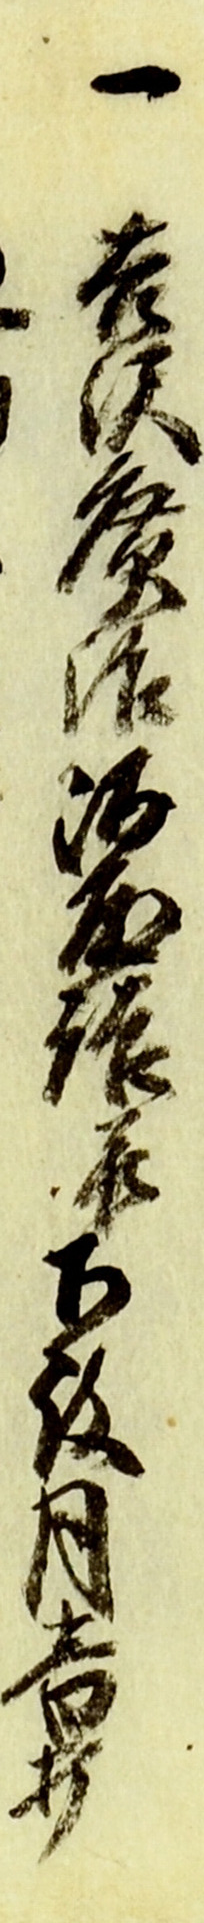一吉沢廣治酒屋詰幷下役月番打
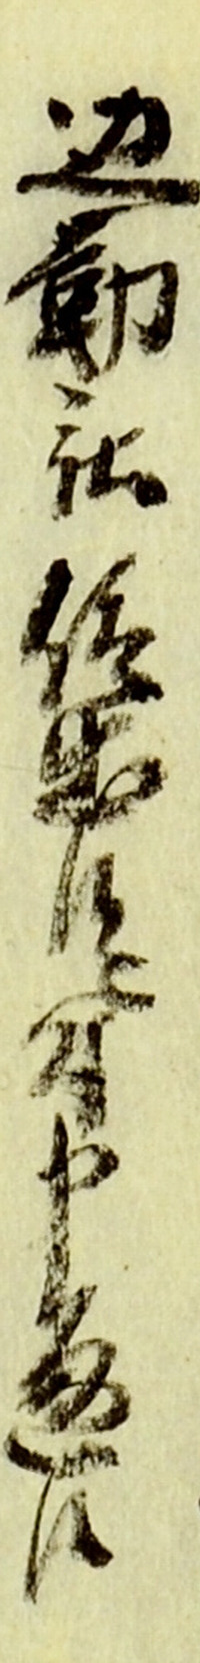込勤被仰出候ニ付申通候
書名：諸事御用留
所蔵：伊那市立高遠町図書館・合同会社AMANE
